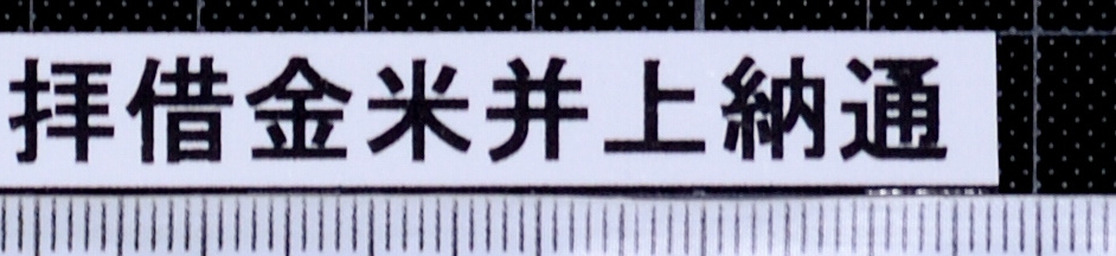拝借金・米并上納通
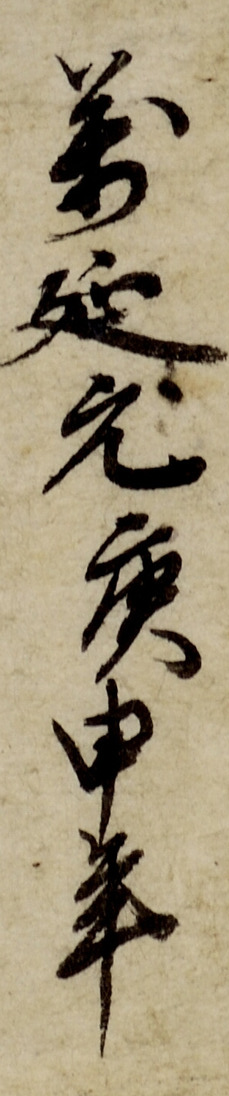万延元庚申年
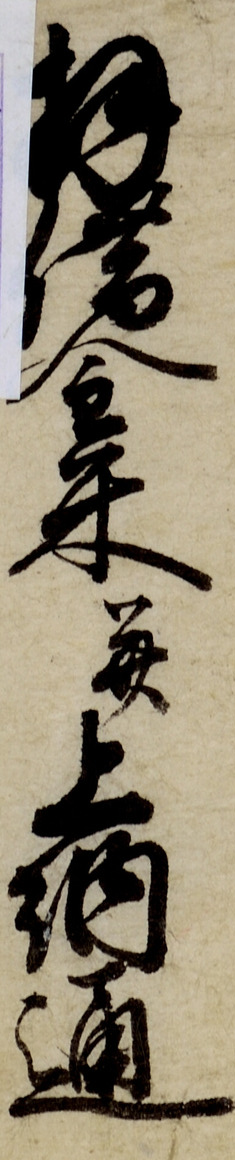拝借金・米并上納通
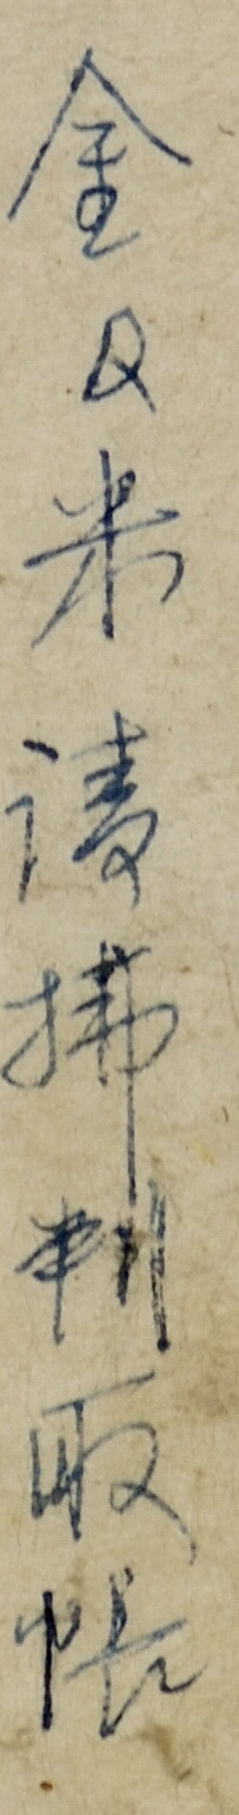金及米請払判取帳
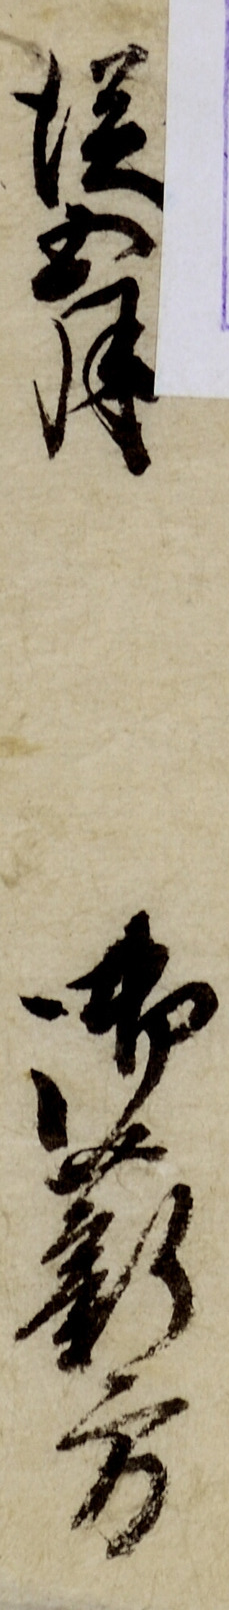従五月御薪方
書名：拝借金米并上納通
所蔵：伊那市立高遠町図書館・合同会社AMANE
